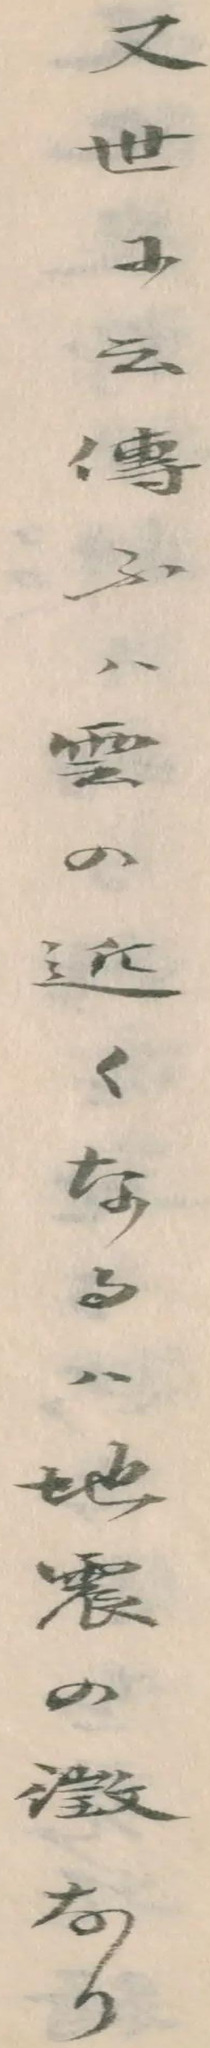又世に云伝ふは雲の近くなるは地震の徴なり
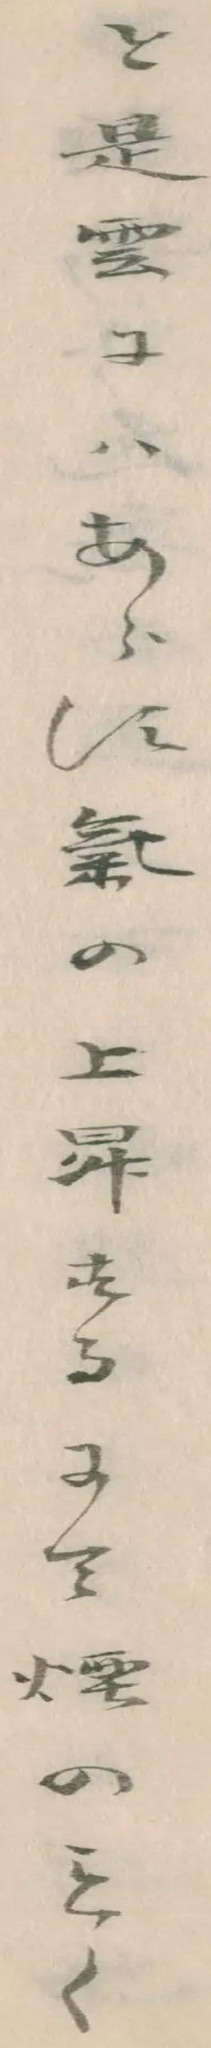と是雲にはあらす気の上昇するにて煙のことく
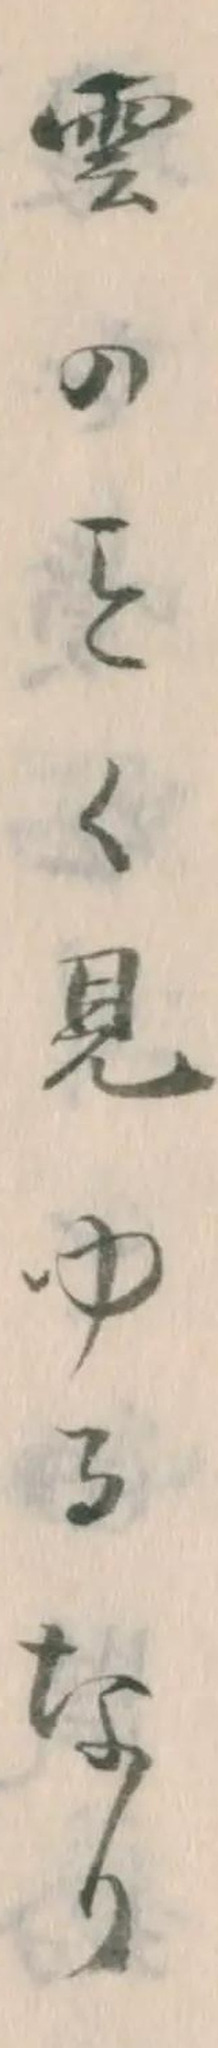雲のことく見ゆるなり
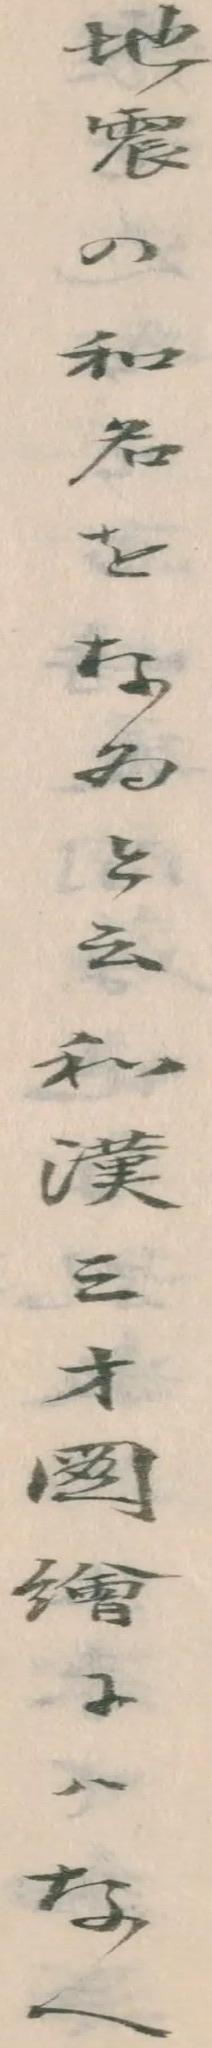地震の和名をなゐと云和漢三才図絵にはなへ
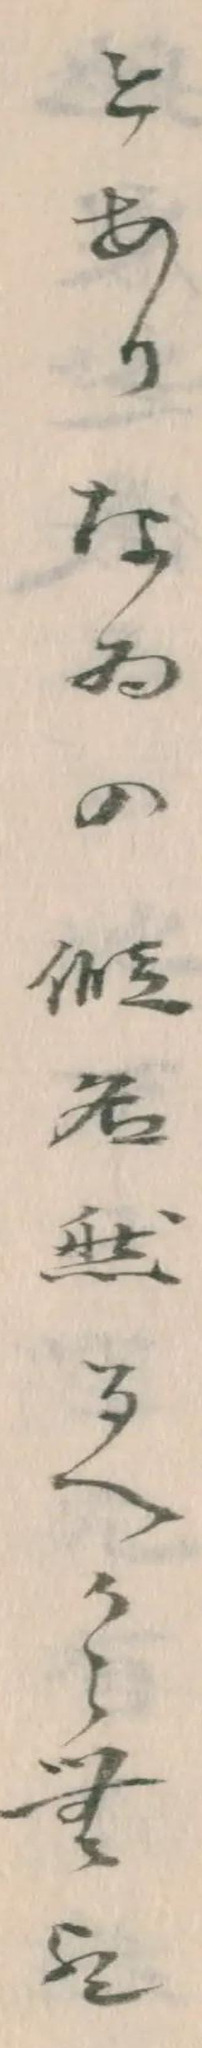とありなゐの仮名然るへからむ歟
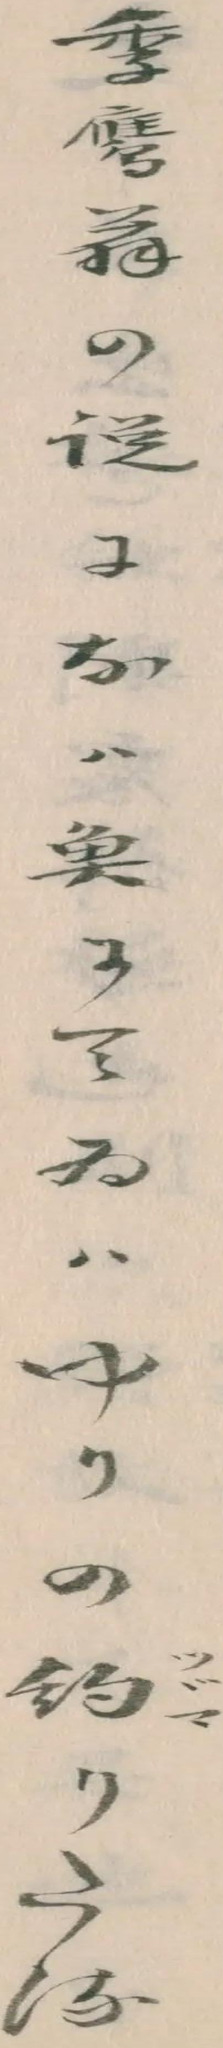季鷹翁の説になは魚にてゐはゆりの約りたる
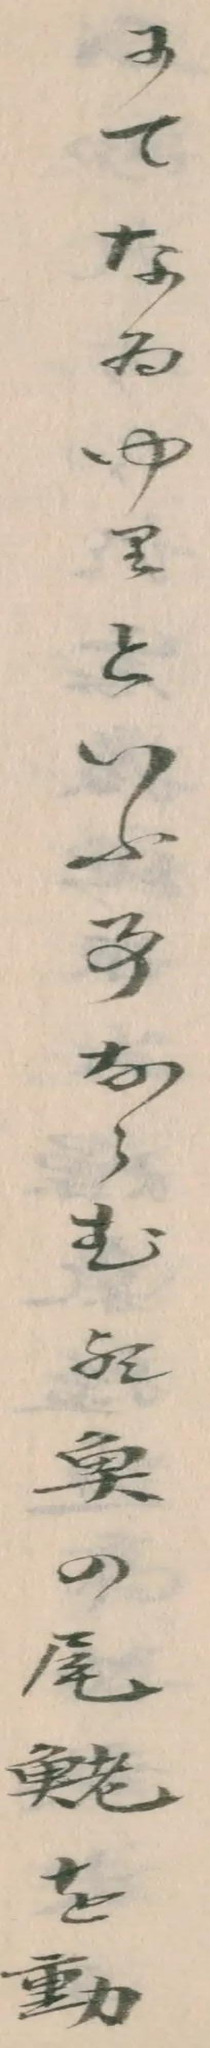にてなゐゆりといふ事ならむ歟魚の尾鰭を動
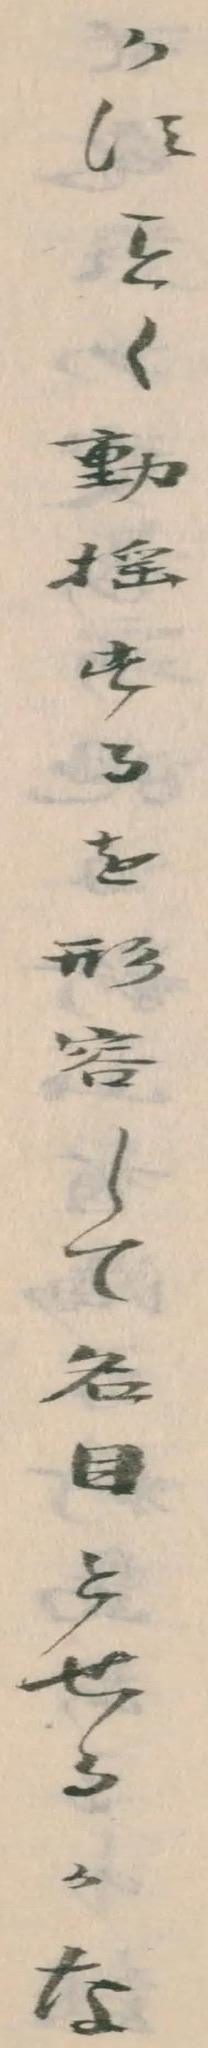かすことく動揺するを形容して名目とせるかな
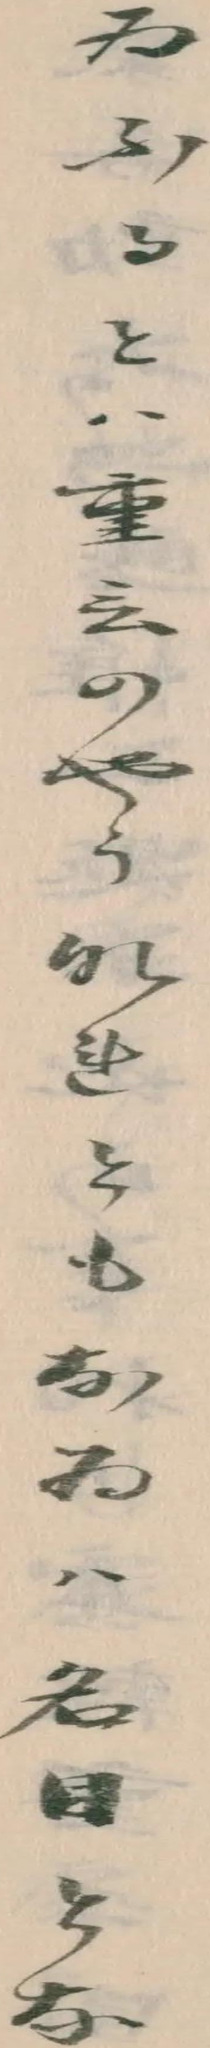ゐふるとは重言のやうなれともなゐは名目とな
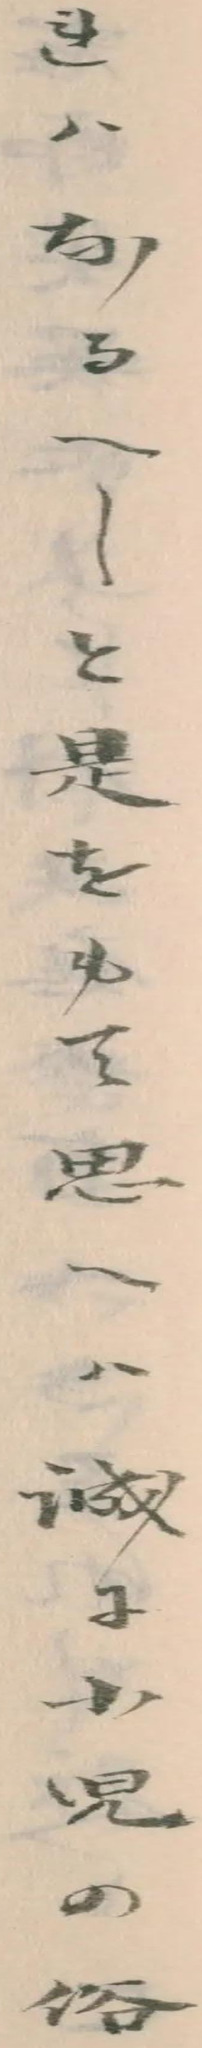れはなるへしと是をもて思へは誠に小児の俗
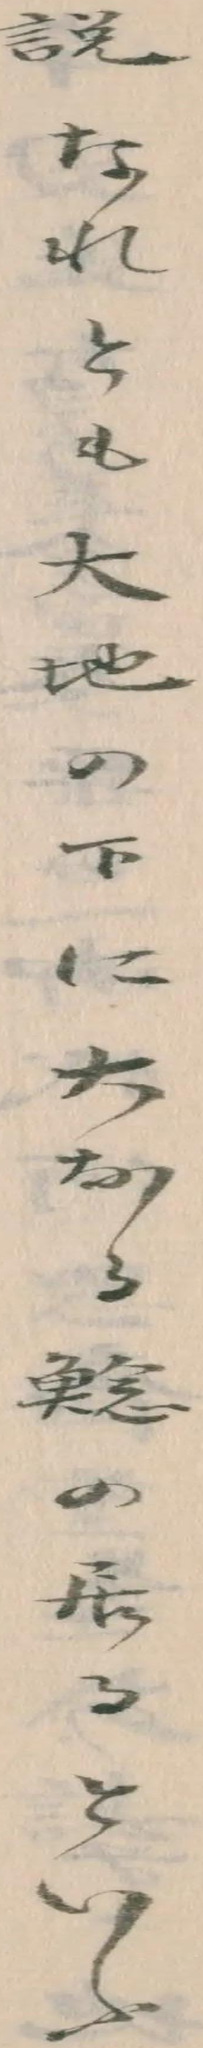説なれとも大地の下に大なる鯰の居るといふ
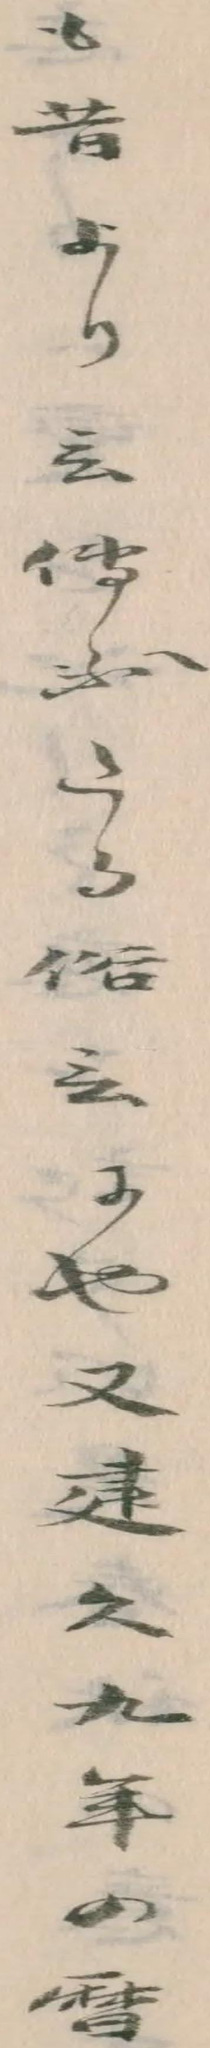も昔より言伝へたる俗言にや又建久九年の暦
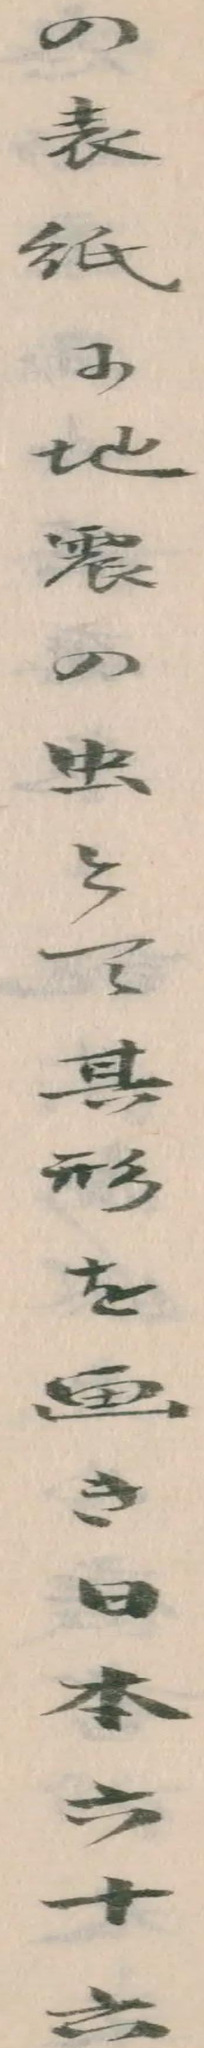の表紙に地震の虫とて其形を画き日本六十六
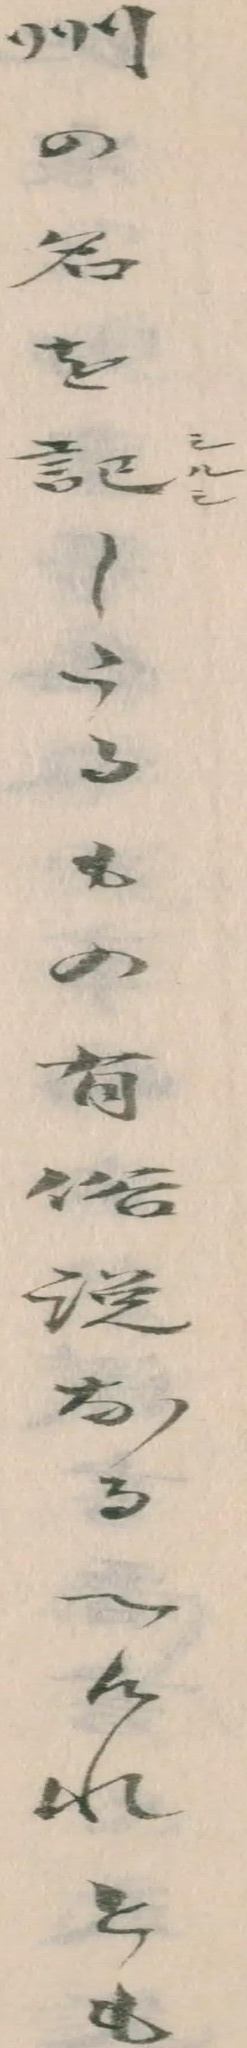州の名を記したるもの有俗説なるへけれとも
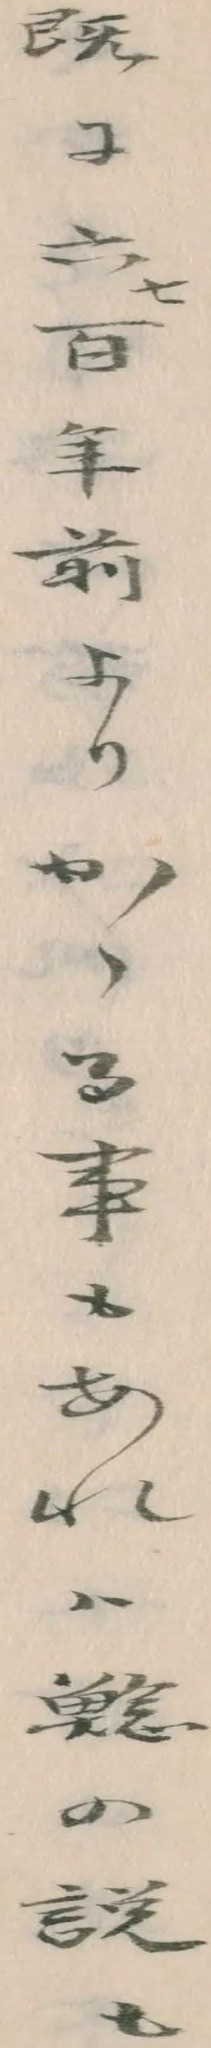既に六七百年前よりかゝる事もあれは鯰の説も
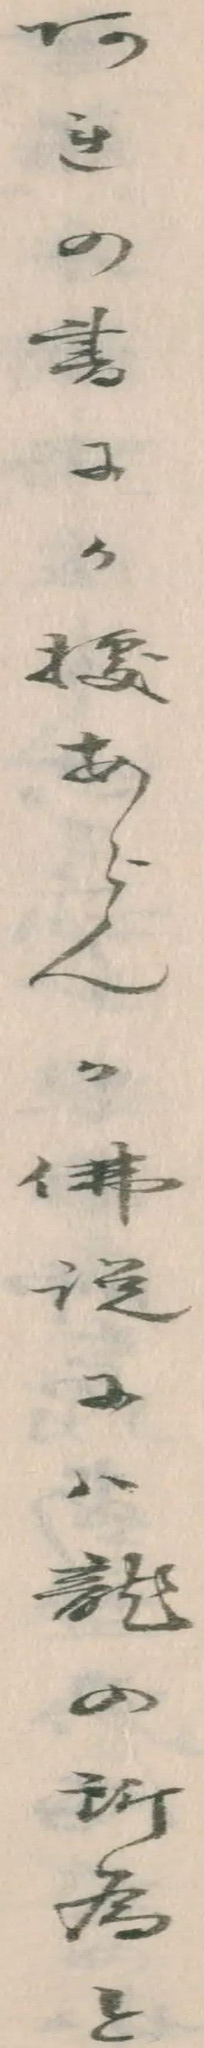何れの書にか拠あらんか仏説には龍の所為と
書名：地災撮要. 巻11-12(地震之部)
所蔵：国立国会図書館 National Diet Library, JAPAN
